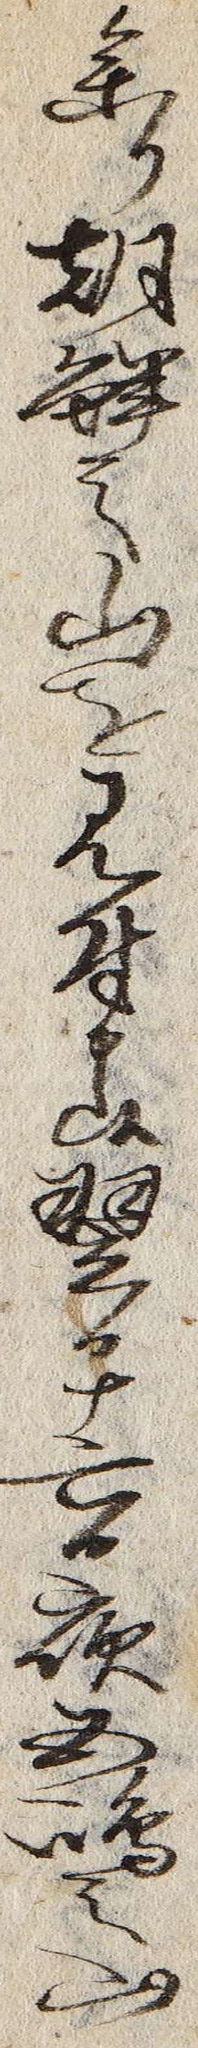参り朝鮮の山を見付申候翌日十六日夜五島の山
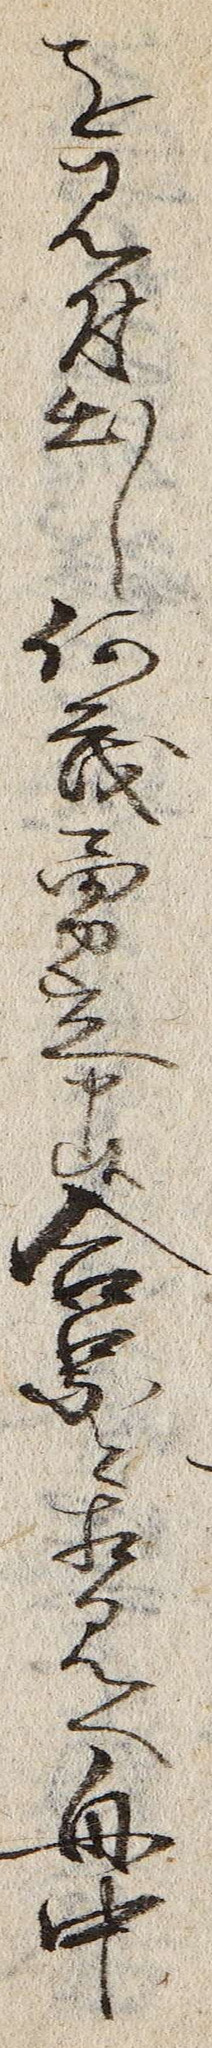を見付出し何も勇立申候合図と相見へ舟中
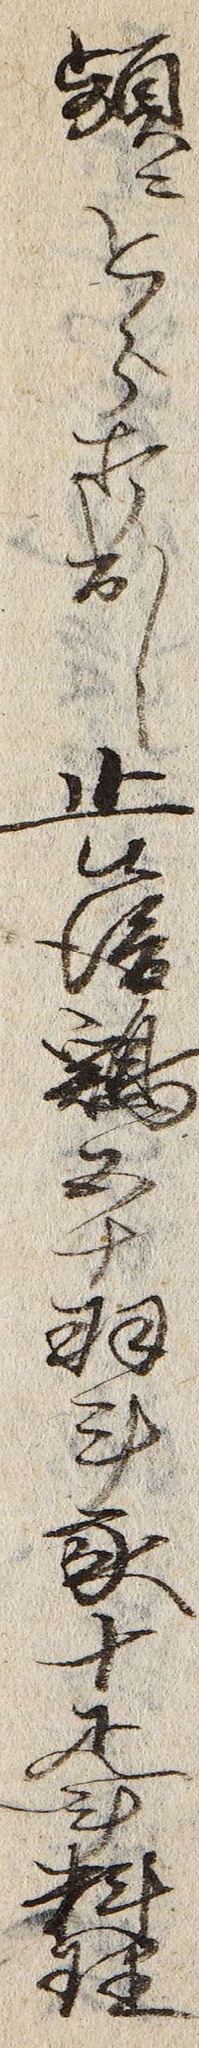頻にとら打出し止候後鶏五十羽斗豕十匹斗料理
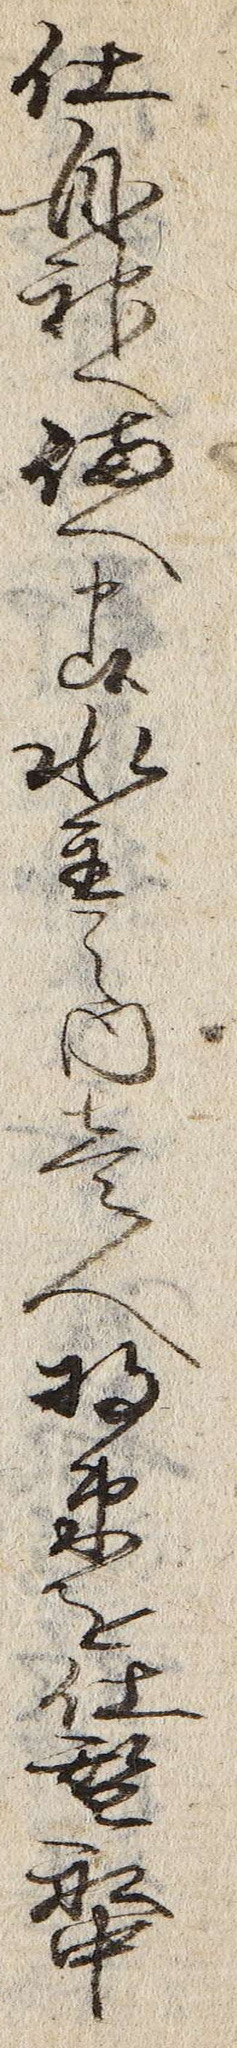仕舟神へ備へ申候水主の内一人将束を仕替船中
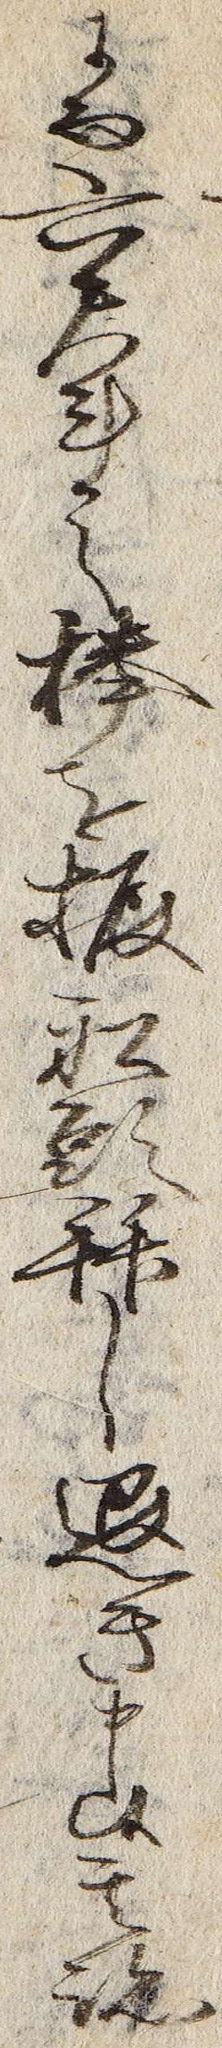にて六尺斗の棒を振船頭拝し退き申候其跡
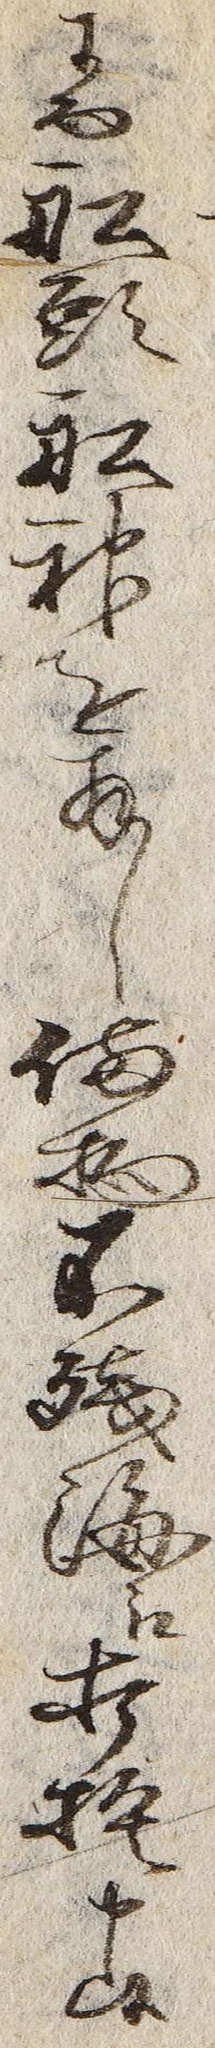にて船頭船神を拝し備物不残海へ打捨申候
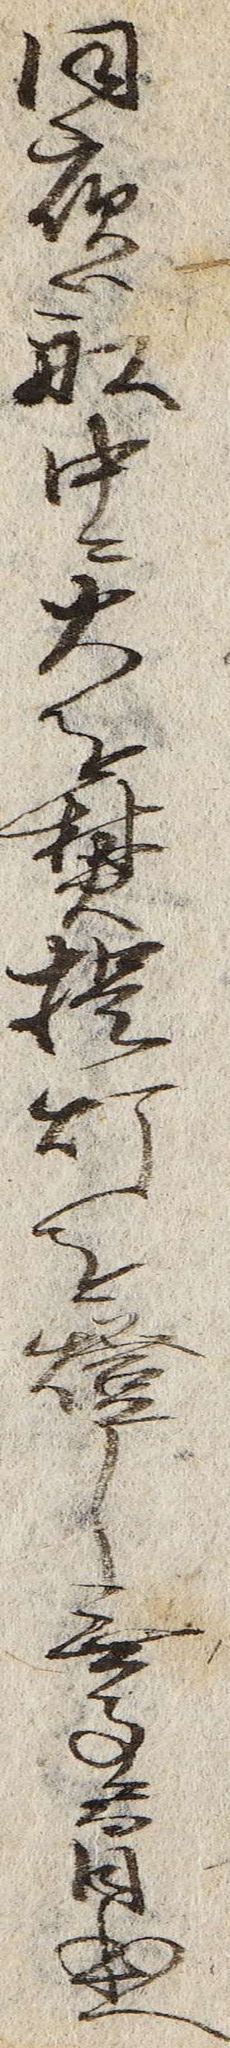同夜は船中に火を焚提灯を灯し無事にて日本へ
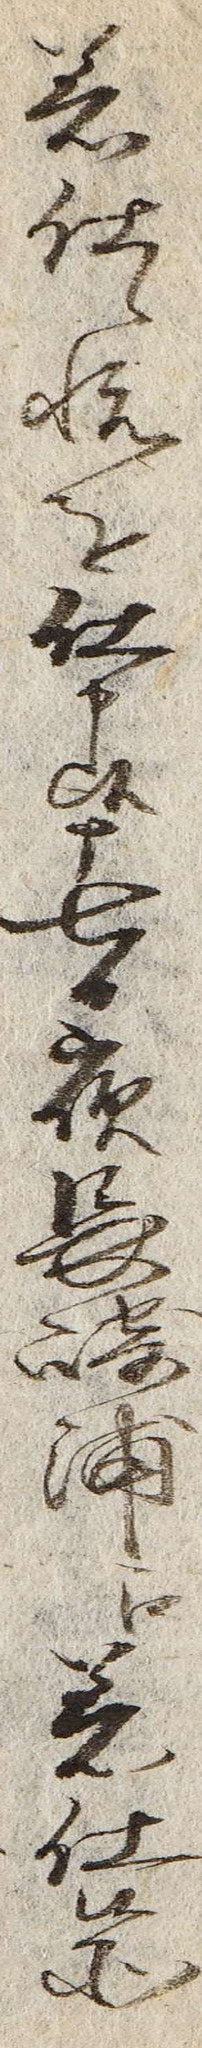着仕候悦を仕申候十七日夜長崎浦へ着仕候所
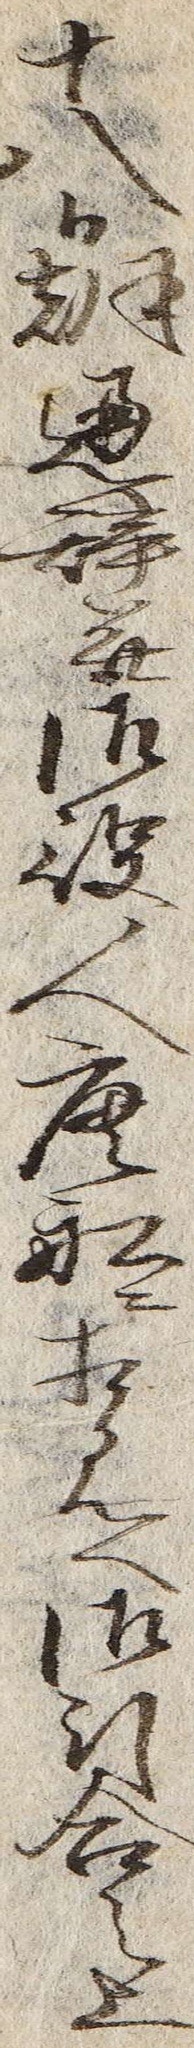十八日朝通辞幷御役人唐船に相見へ御引合の上
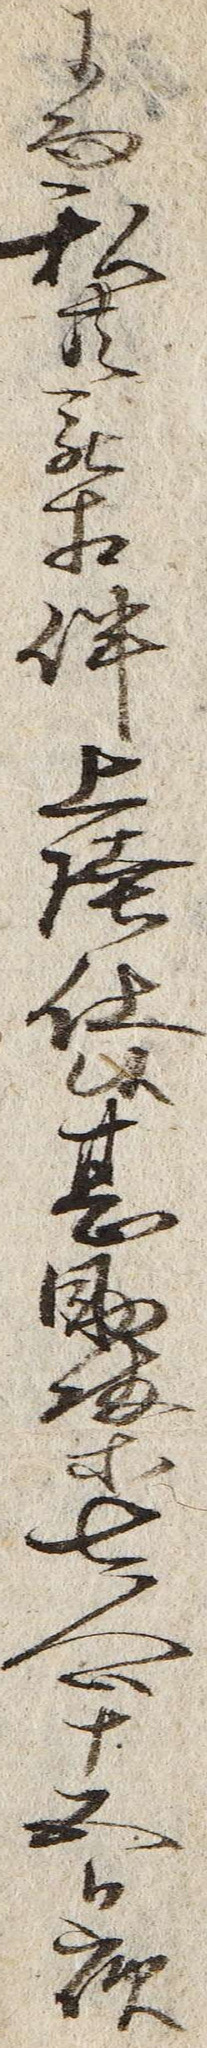にて私ども被相伴上陸仕候甚助殿等七人は十五日夜
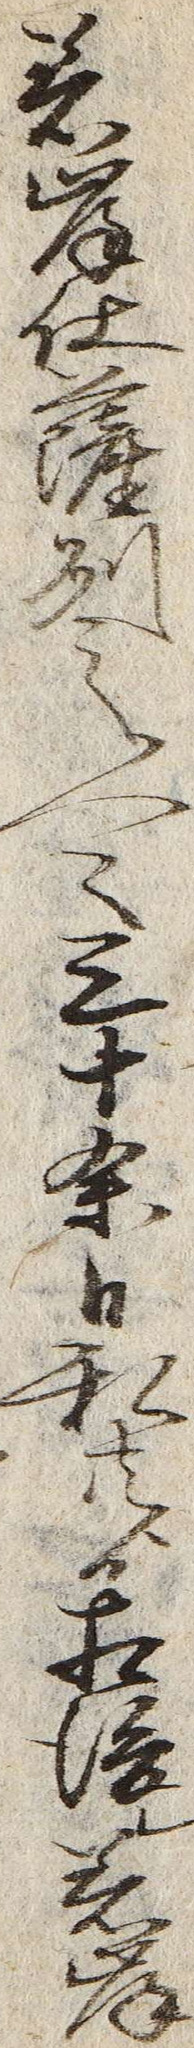着岸仕薩州の人々三十余日私どもより相後れ着岸
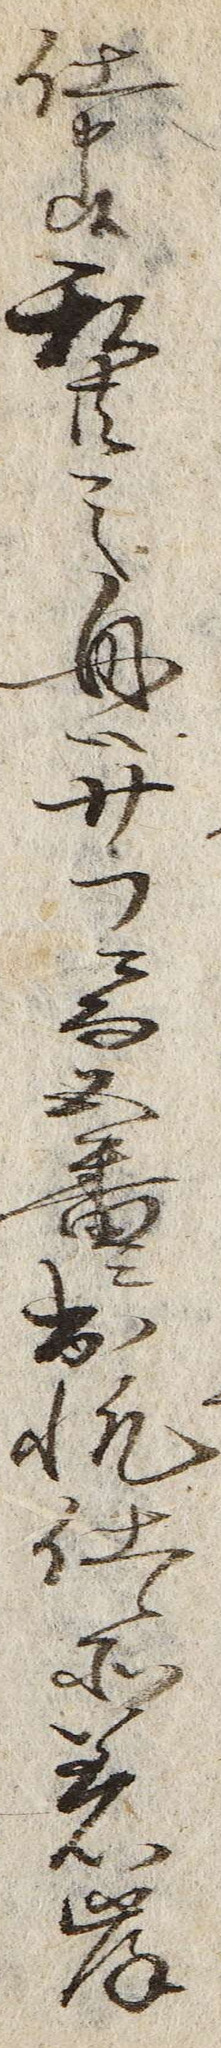仕申候私どもの舟はサフにて五番に出帆仕候所着岸
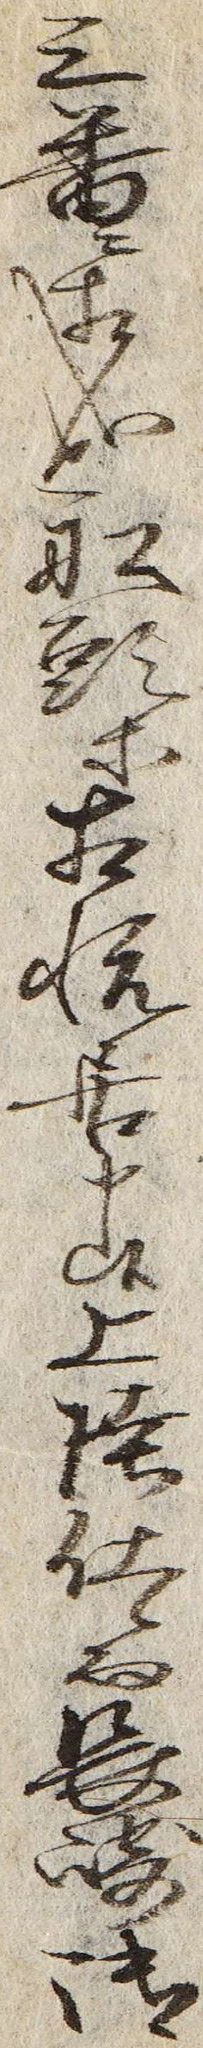三番に相成船頭等相悦居申候上陸仕候て長崎御
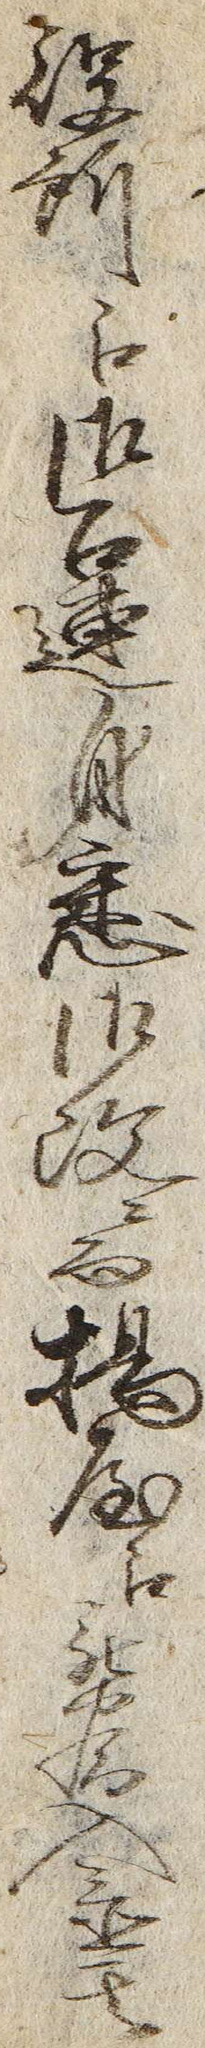役所へ御召連身恙御改にて揚屋へ被為入置其

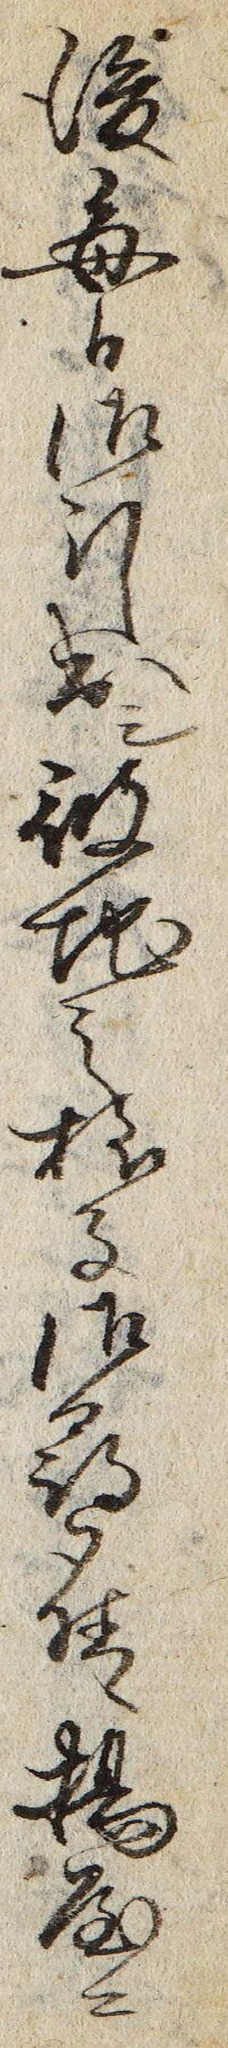後毎日御引出し彼地の様子御尋御座候揚屋に
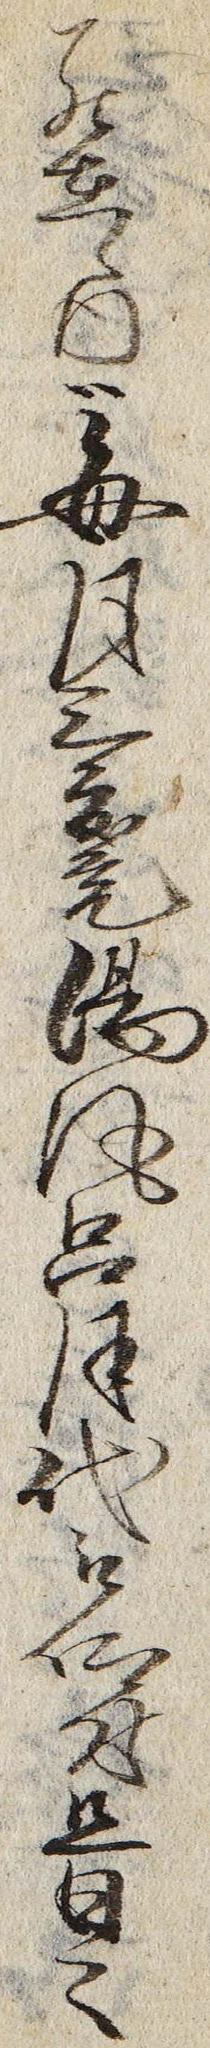罷在候内は毎月三度宛湯風呂月代被仰付且日々
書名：能登国清兵衛異国江漂流之始末
